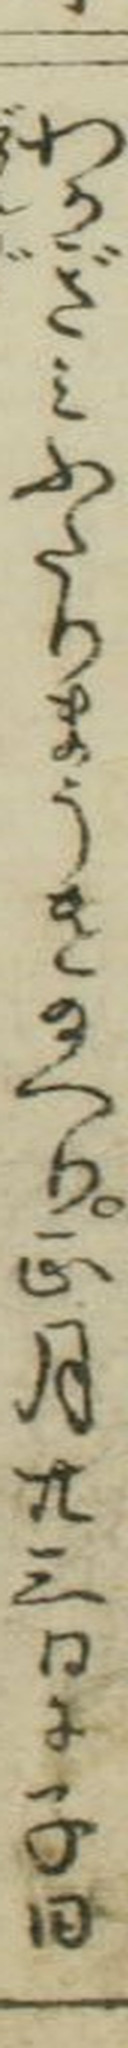わかぎみふたりまうけ給へり。正月廿三日に子日
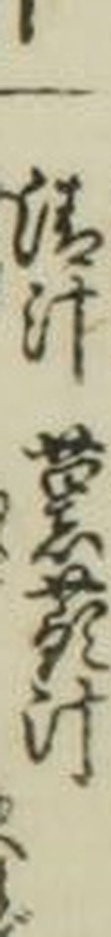清汁薯蕷汁
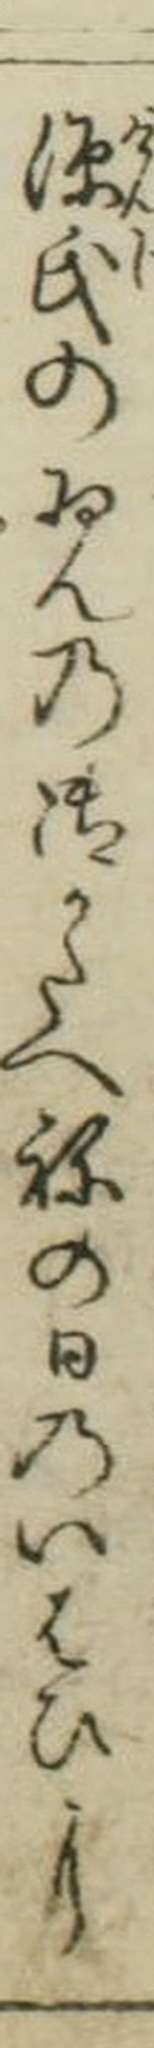源氏のゐんの御かたへねのひのいはひに
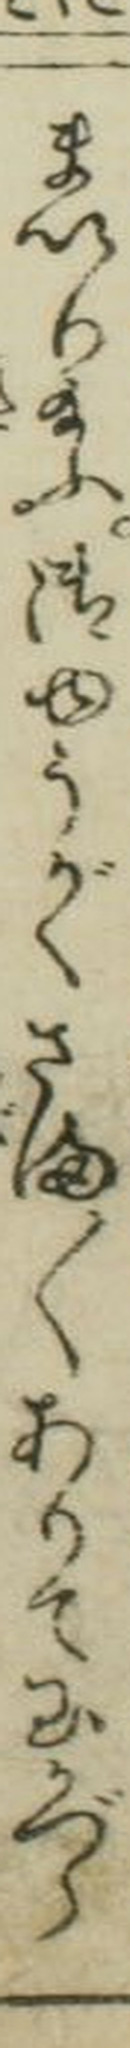まいり給ふ。御ゆうがくさま〳〵ありて玉かづら
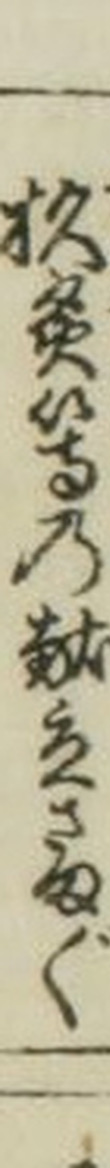杉炙等の献立さま〴〵
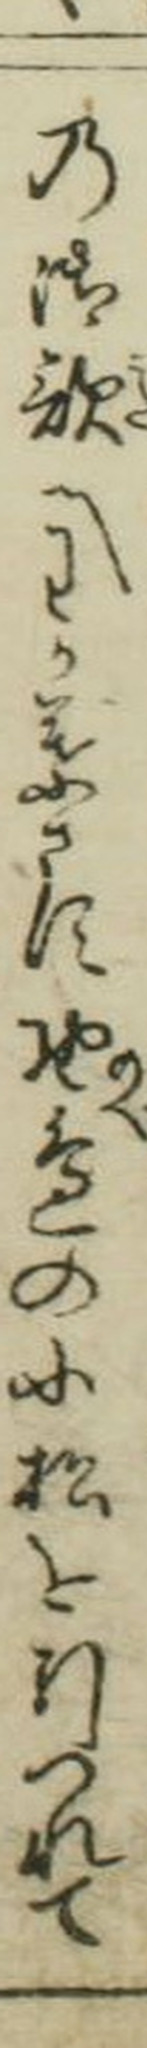の御歌〽わか”葉さす野辺の小松を引つれて
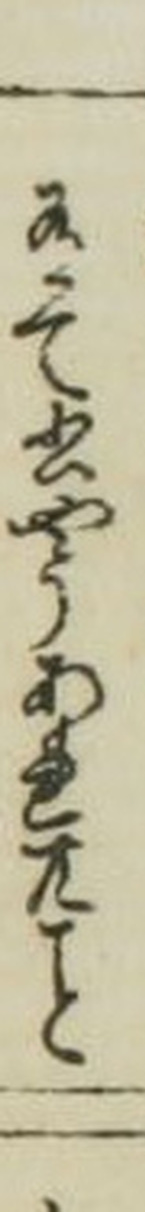有て書やうあれ共こと
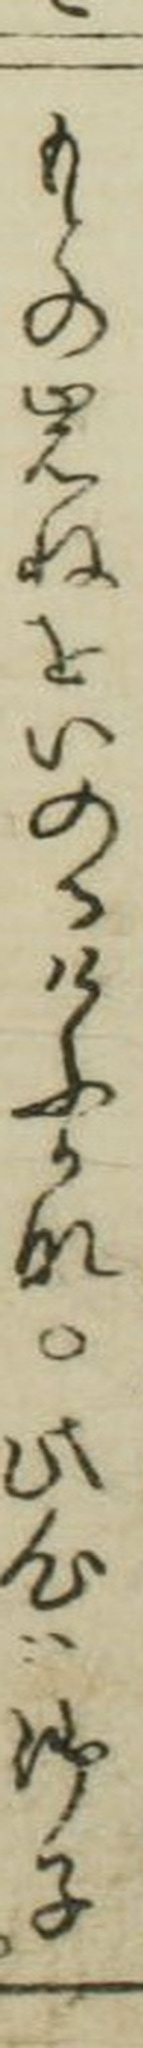もとの岩ねをいのるけふかな◯此心は御子
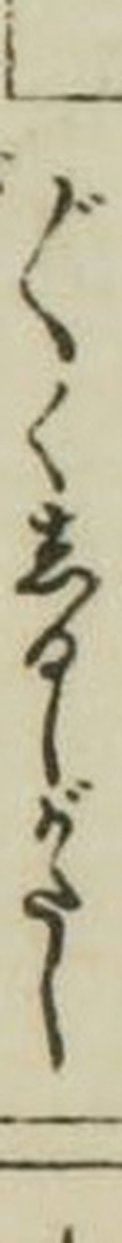〴〵くしるしがたし
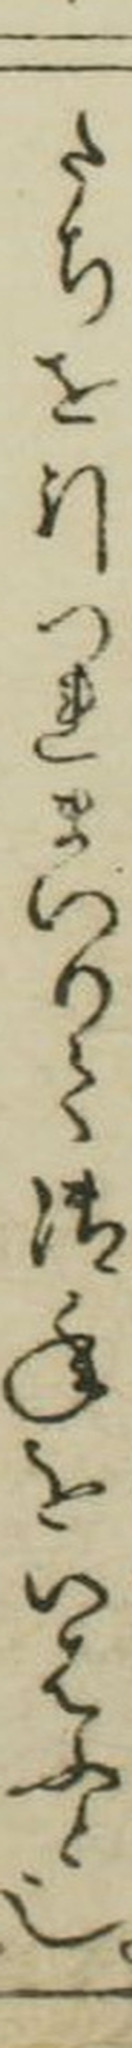たちを引つれまいりて御年をいはふと也。
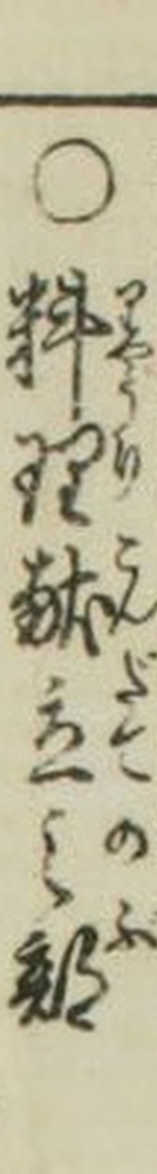◯料理献立之部
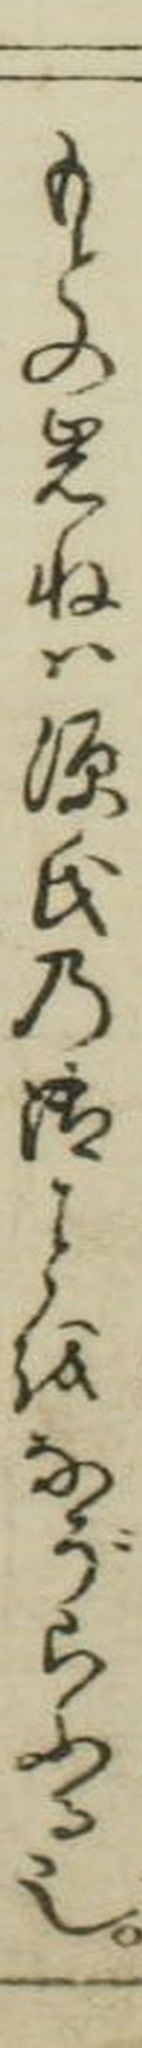もとの岩ねは源氏の御ことをなぞらふる也
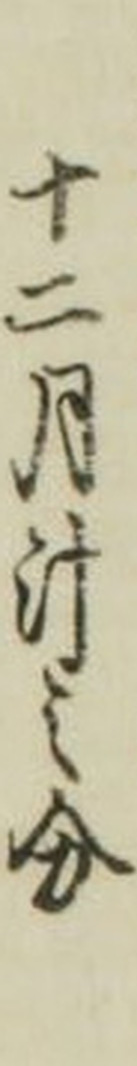十二月汁之分
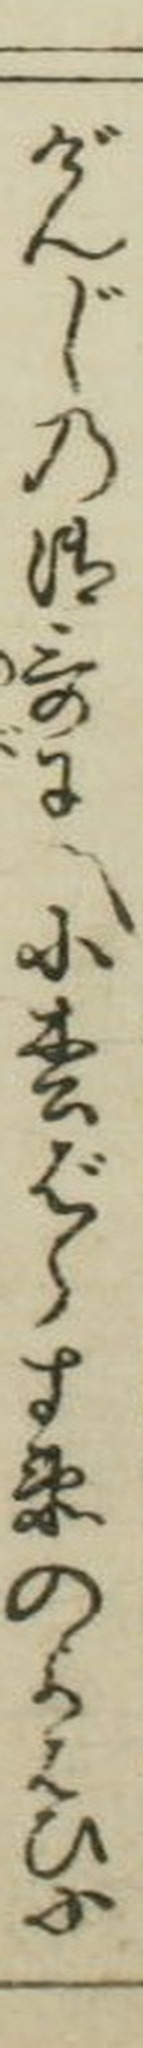げんじの御哥に〽小松ばらすゑのよはひに
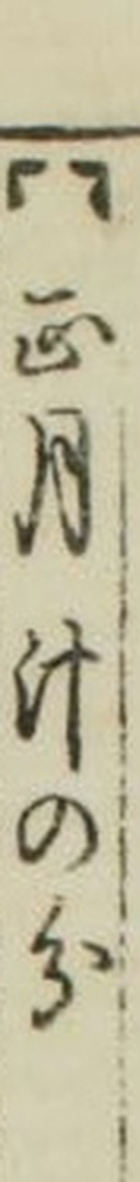正月汁の分
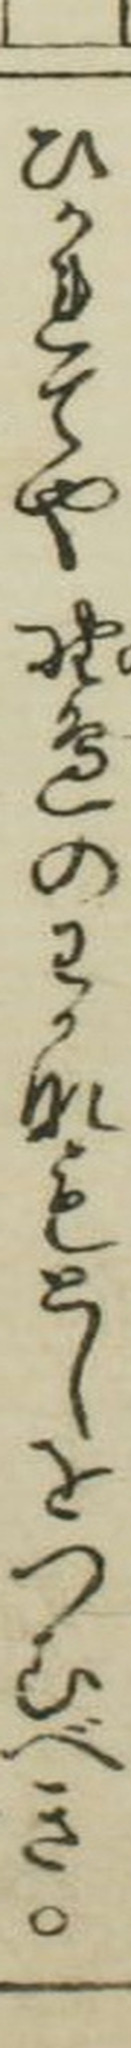ひかれてや野辺のわかれもとしをつむべき◯
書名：女源氏教訓鑑
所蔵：東京学芸大学附属図書館
